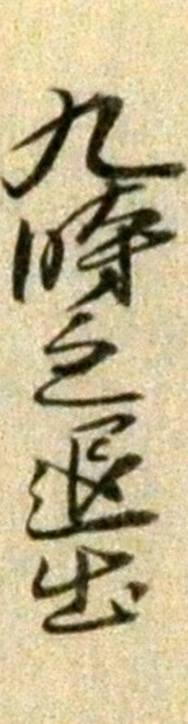九時過退出
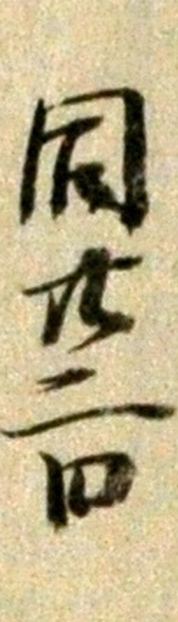同廿二日
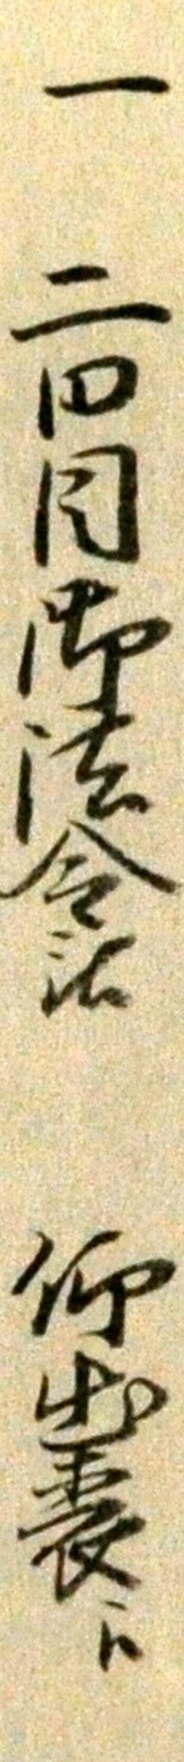一二日目御法令被仰出表え
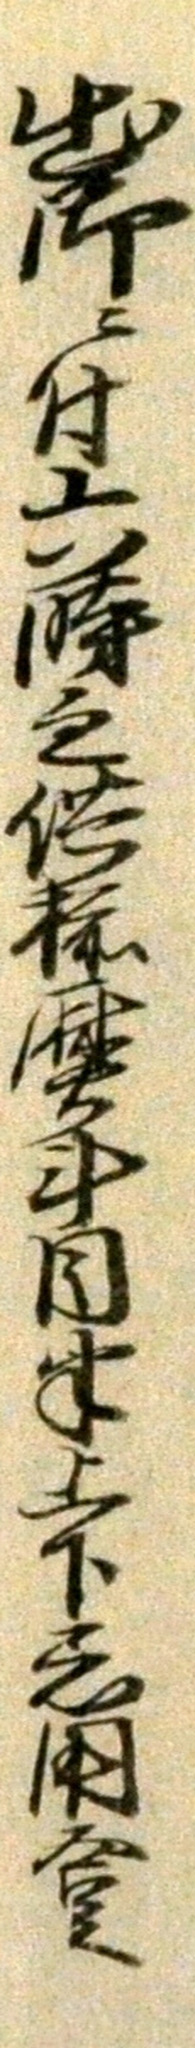出御ニ付六時過供揃熨斗目半上下着用登
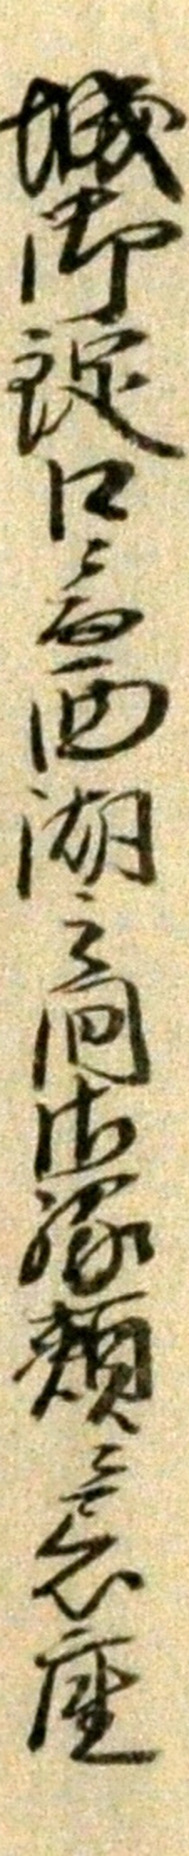城御錠口ニ而西湖之間御縁頬ニ着座
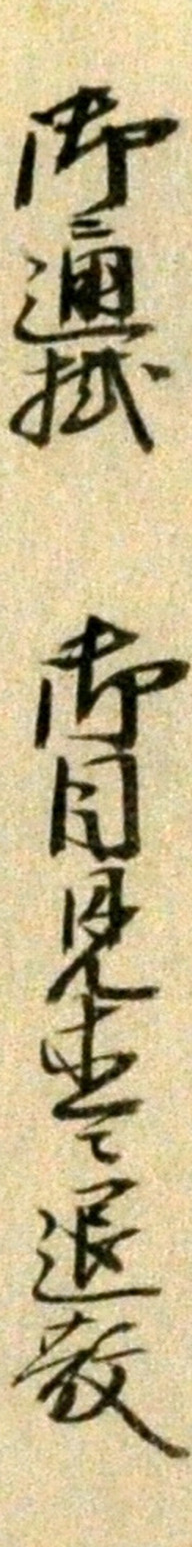御通掛御目見直ニ退散
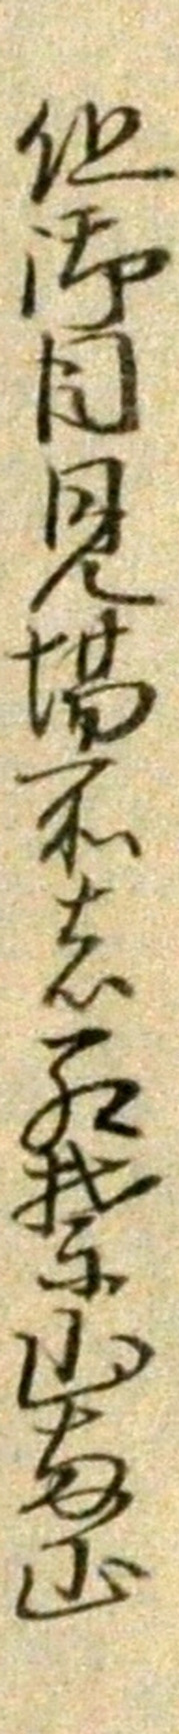但御目見場所は紅葉山両山
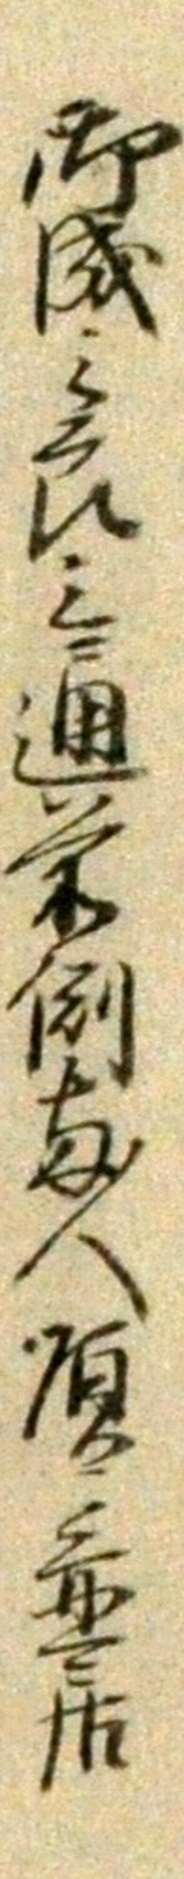御成之節之通前側両人順ニ並居
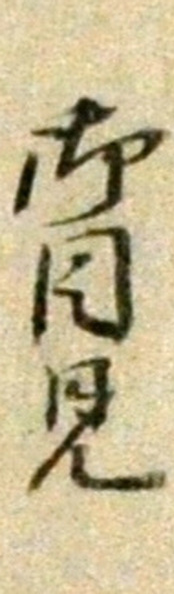御目見
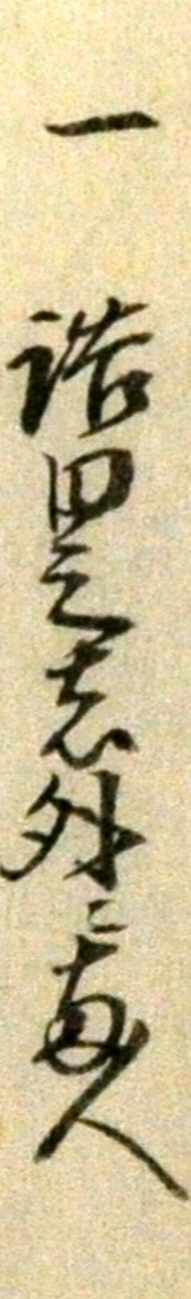一詰日之者外ニ両人
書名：御代替ニ付御法令仰出サレ候節ノ留
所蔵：伊那市立高遠町図書館・合同会社AMANE
